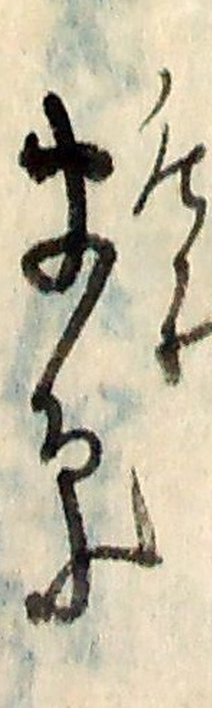半兵衛
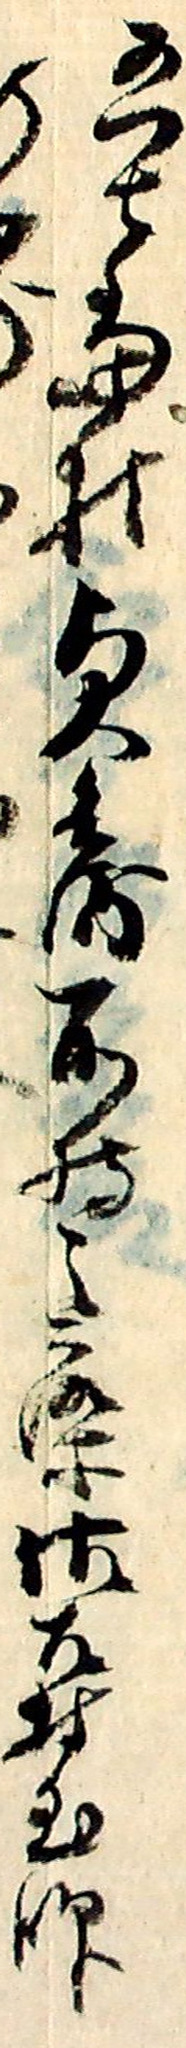右は当村貞兵衛所持之蒅佐古村玉師
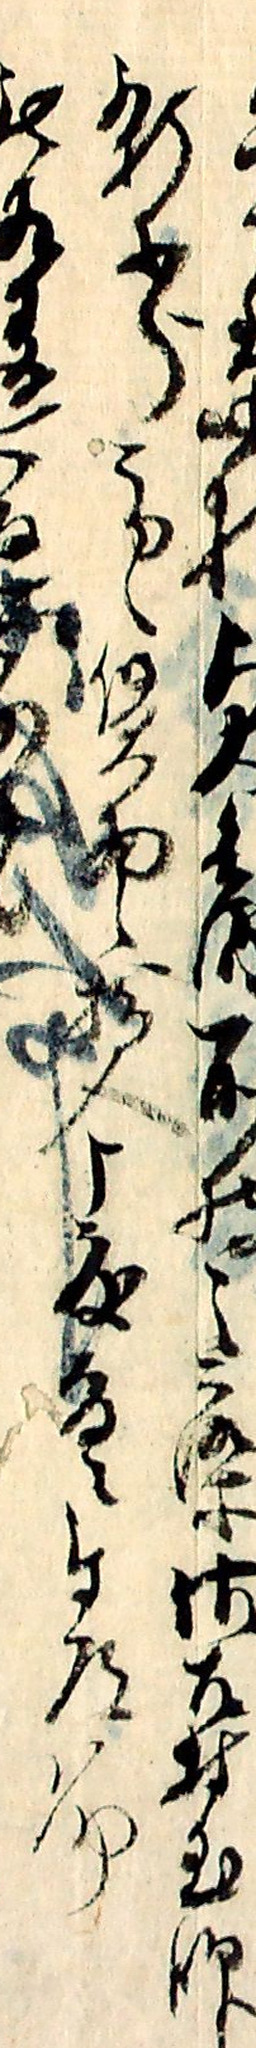新五郎方へ質物に指入申度旨に付道筋
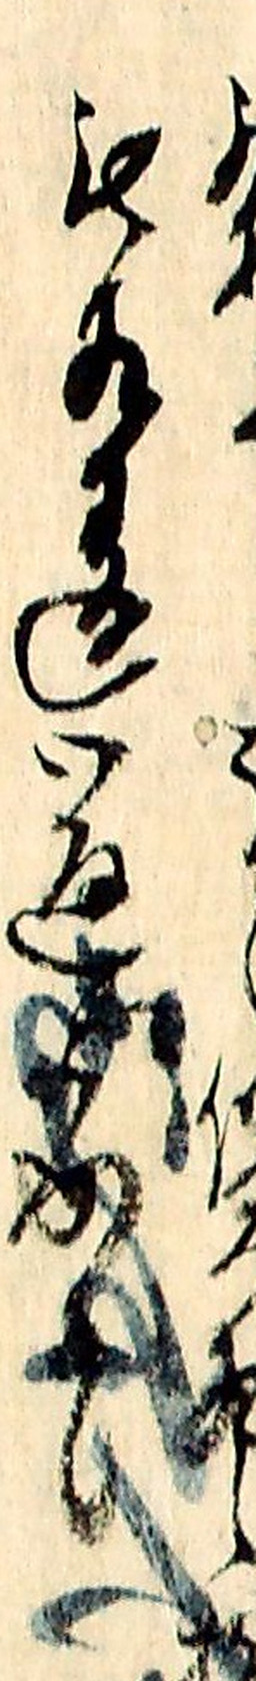無相違御通被成可被下候
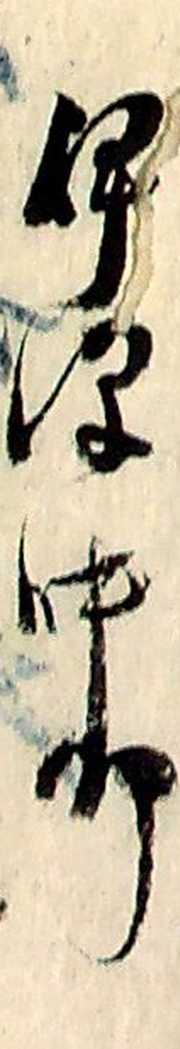伊沢仲助

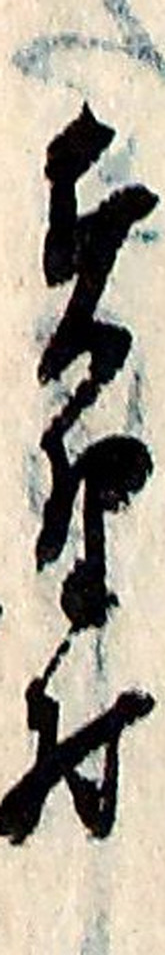矢野村
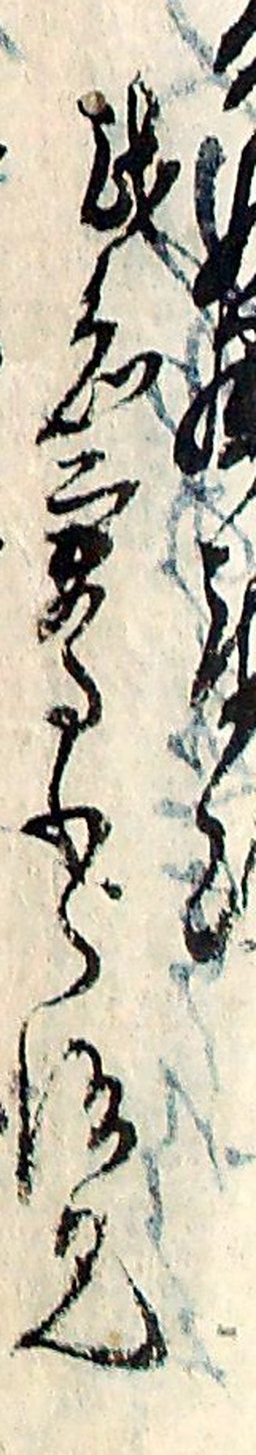武知実多五郎後見
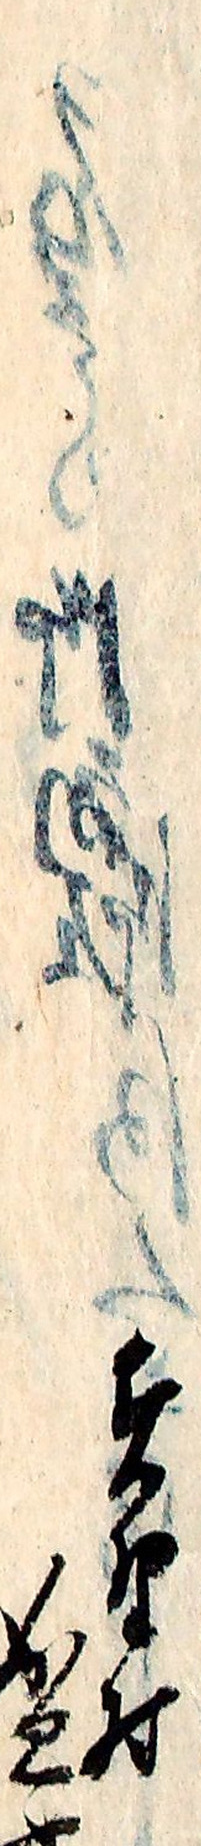矢野村
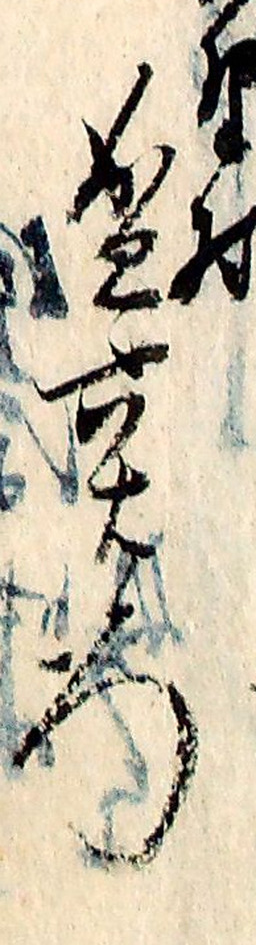盛六右衛門
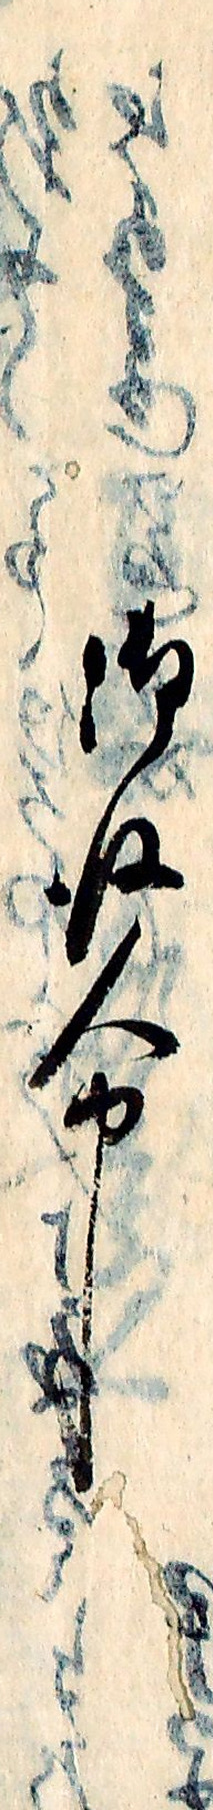御役人中
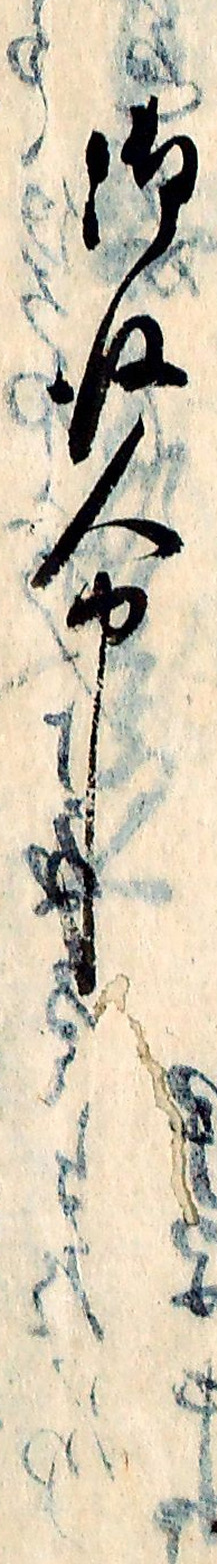御役人中

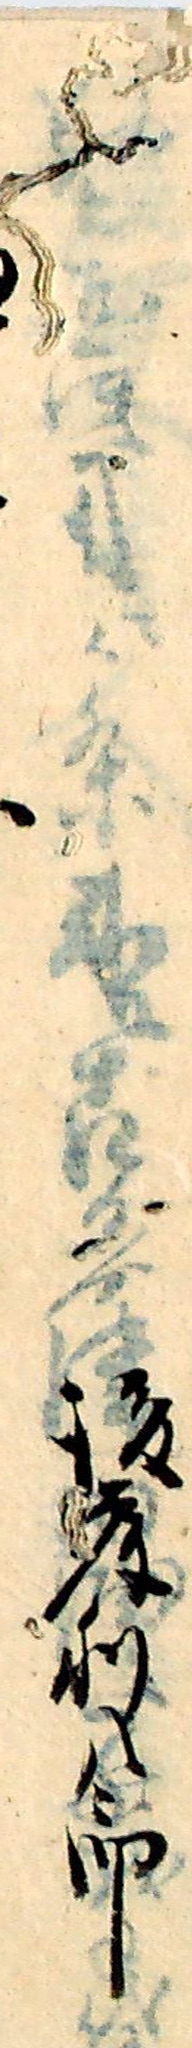後藤利八郎
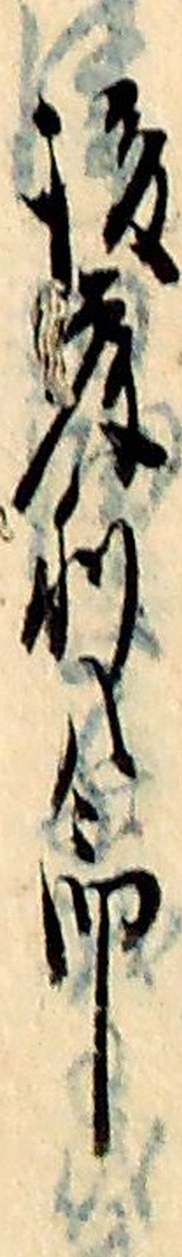後藤利八郎
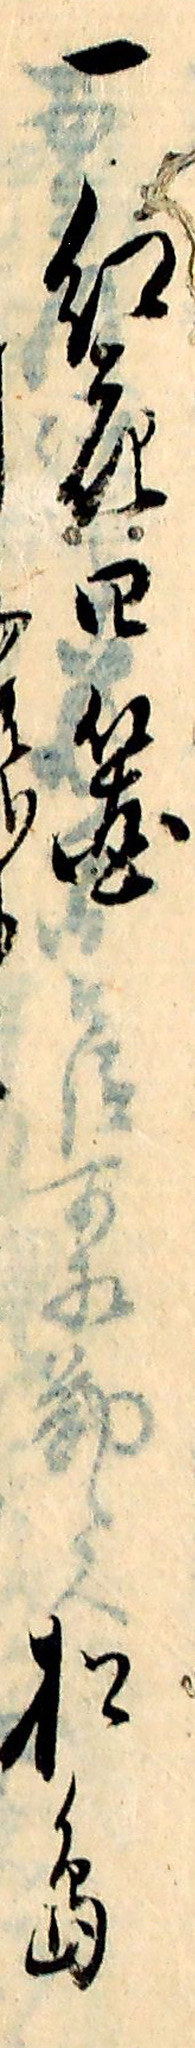一紅花四箇松島
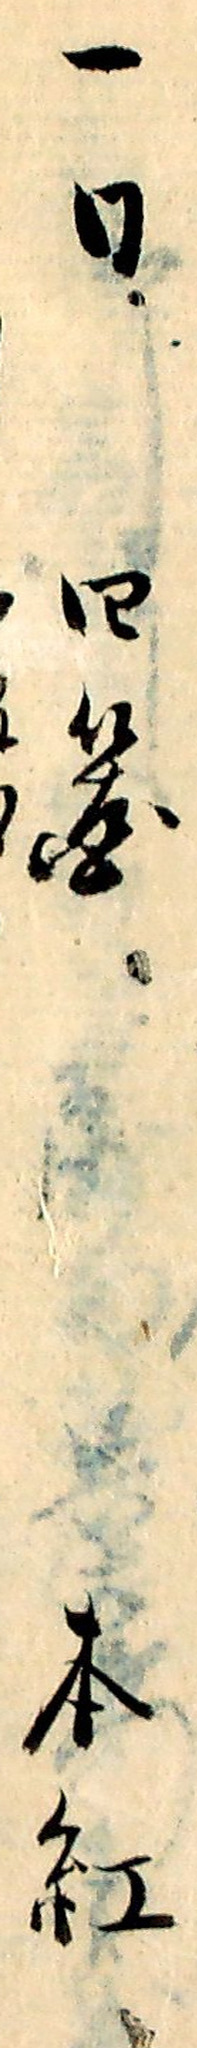一同四箇本紅
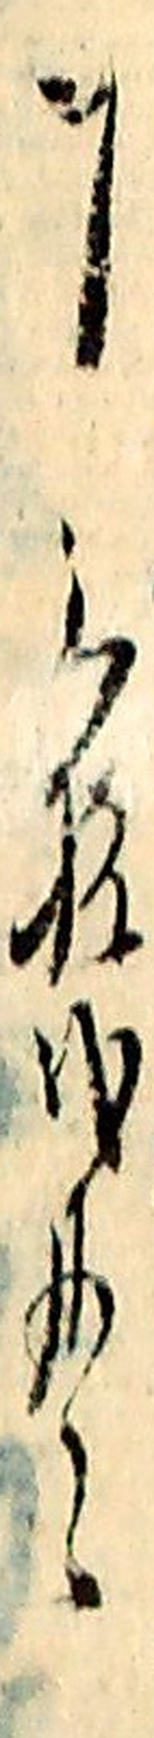正三拾弐貫
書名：諸御願書控(後藤氏壱番）
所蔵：鳴門教育大学 Naruto University of Education
